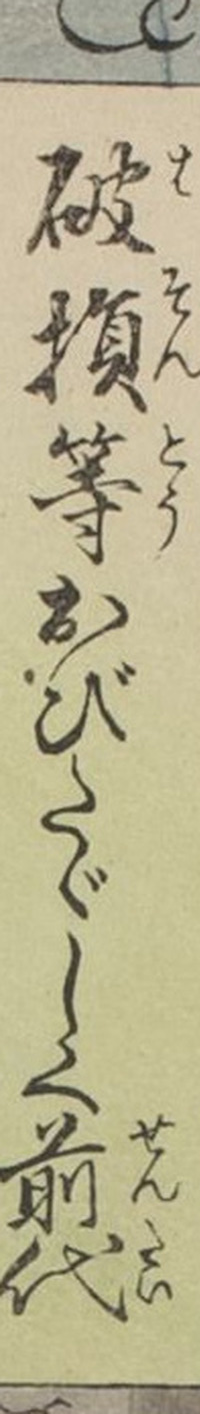破損等おびたゞしく前代
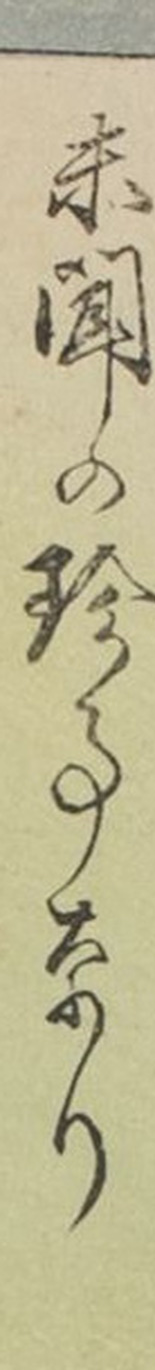未聞の珍事なり
